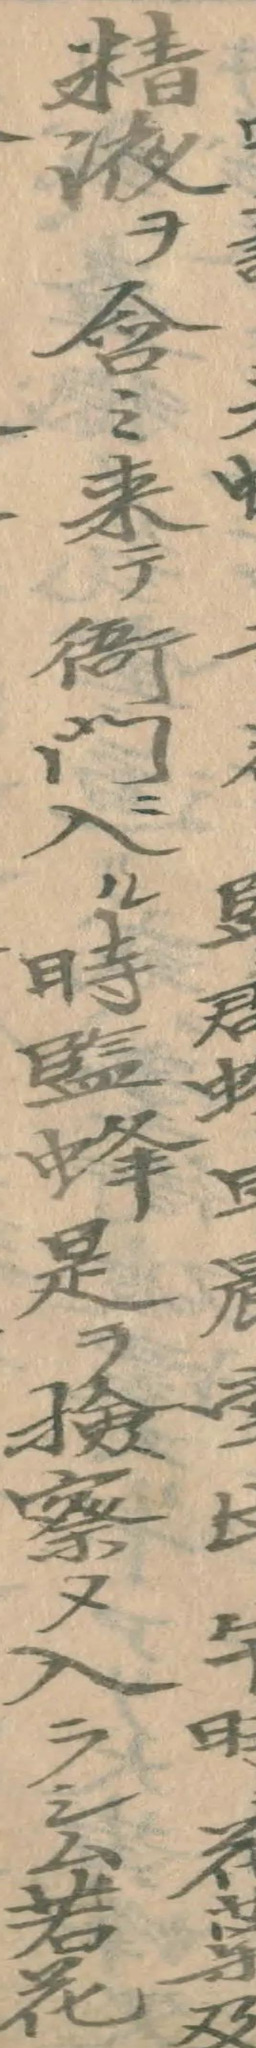精液ヲ含ミ来テ衙門ニ入ル時監蜂是ヲ檢察シテ入ラシム若花
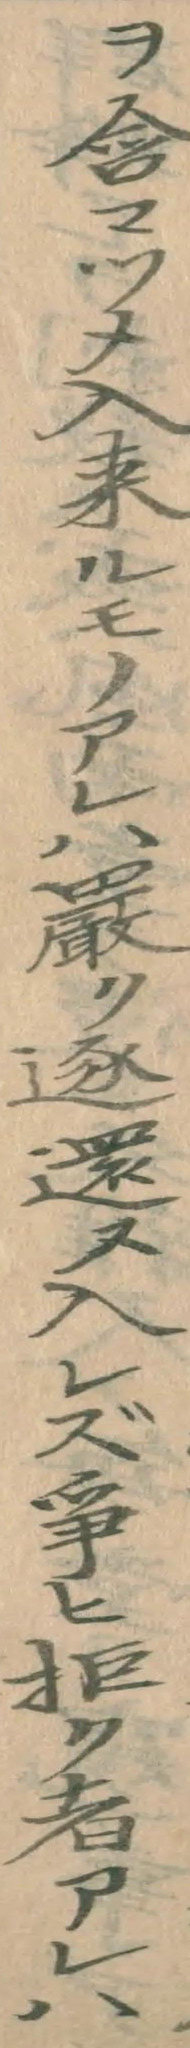ヲ含マツシテ入来ルモノアレハ厳ク逐還シテ入レズ爭ヒ拒ク者アレハ

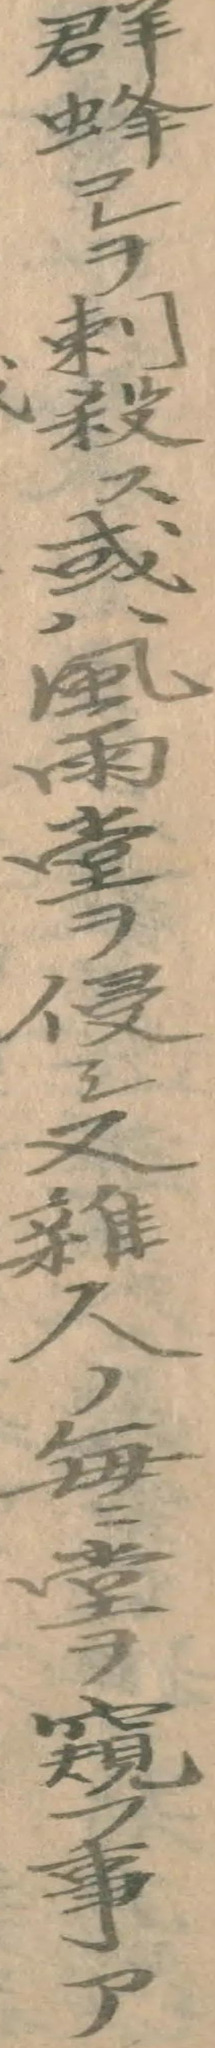群蜂コレヲ刺殺ス或ハ風雨堂ヲ侵シ又雑人ノ毎ニ堂ヲ窺フ事ア
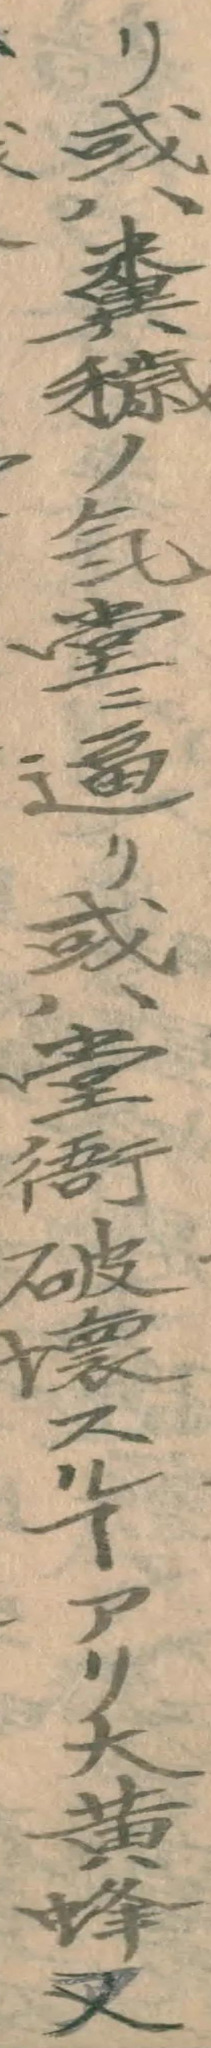リ或ハ糞穢ノ気堂ニ逼リ或ハ堂衙破壊スルコトアリ大黄蜂又
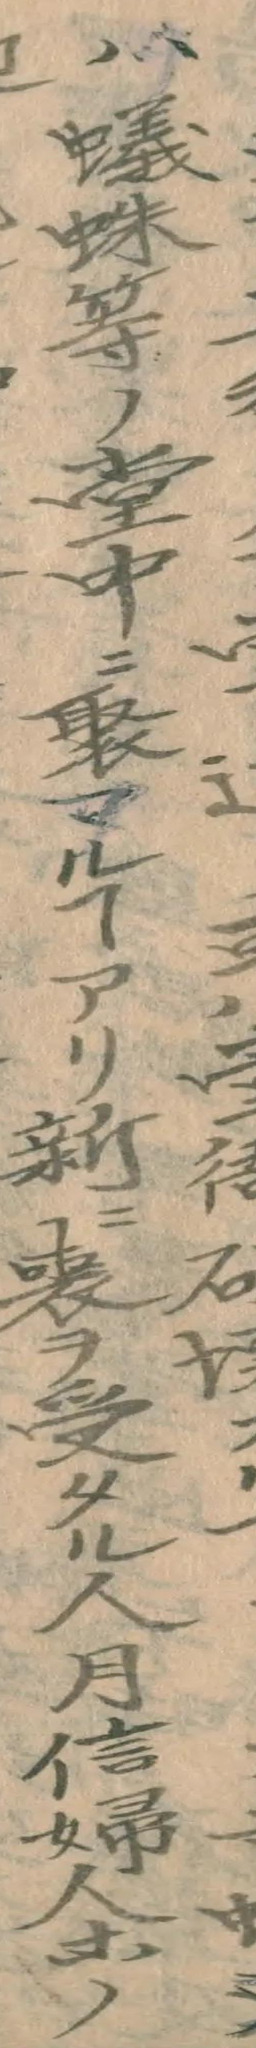ハ蟻蛛等ノ堂中ニ聚マルコトアリ新ニ喪ヲ受タル人月信婦人等ノ
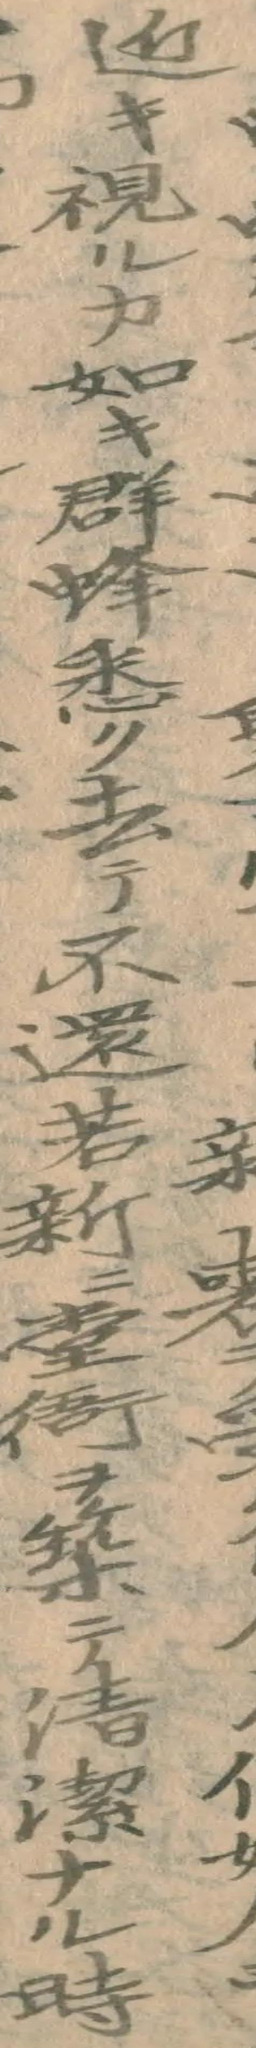近キ視ルカ如キ群蜂悉ク去テ不還若新ニ堂衙ヲ築テ清潔ナル時
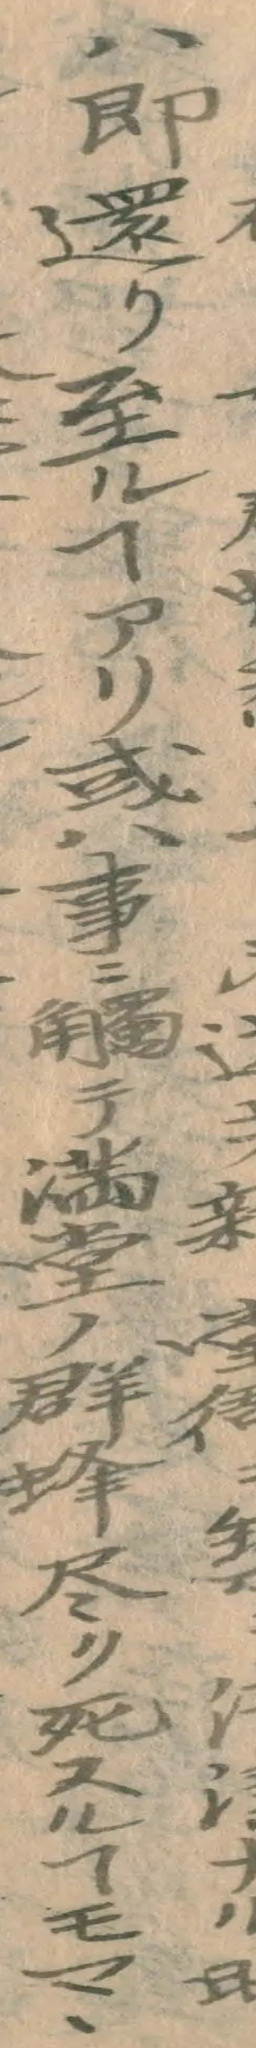ハ即還リ至ルコトアリ或ハ事ニ觸テ満堂ノ群蜂尽ク死スルコトモマヽ
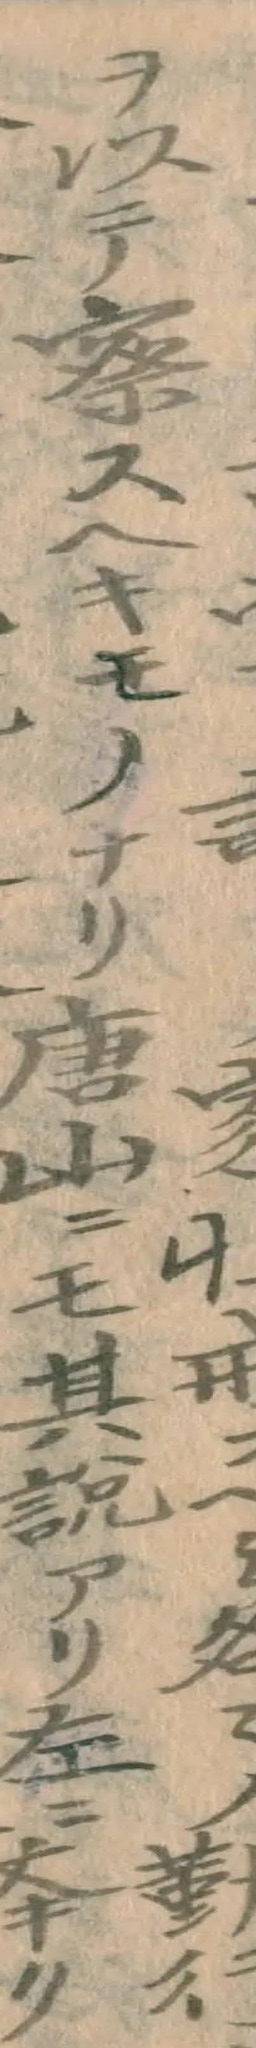ヲ以テ察スヘキモノナリ唐山ニモ其説アリ左ニ挙ク
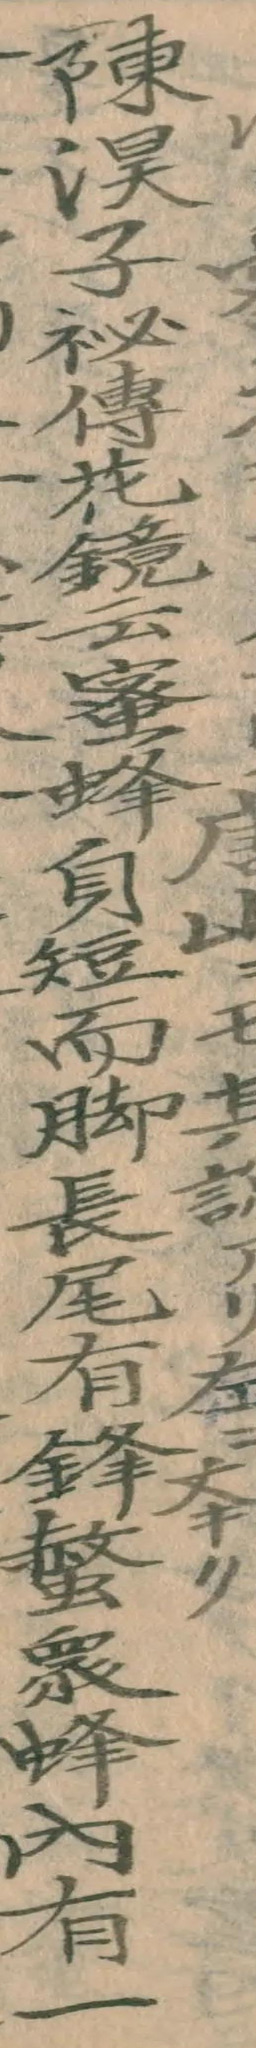陳淏子祕傳花鏡云蜜蜂身短而脚長尾有鋒螫衆蜂内有一
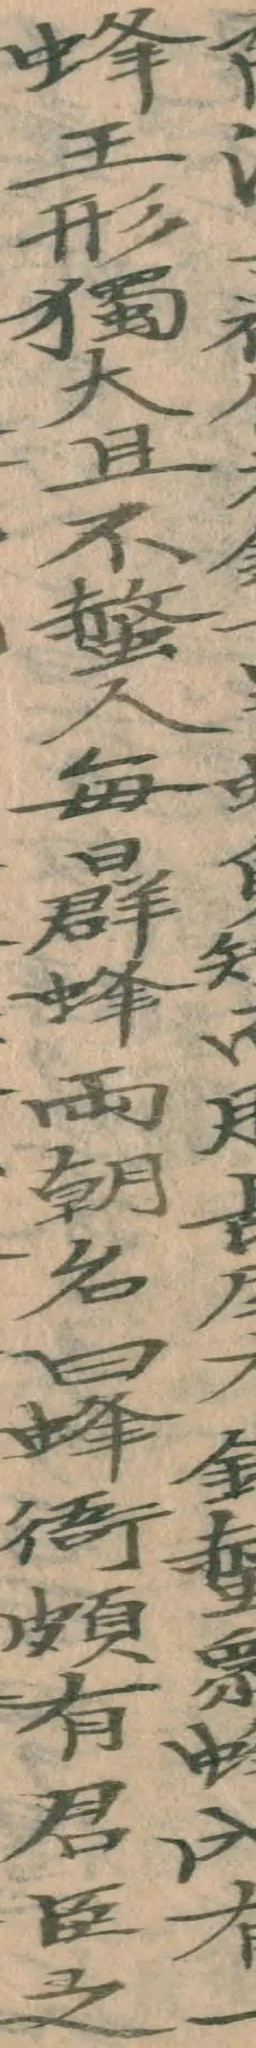蜂王形獨大且不螫人毎日群蜂両朝名曰蜂衙頗有君臣之
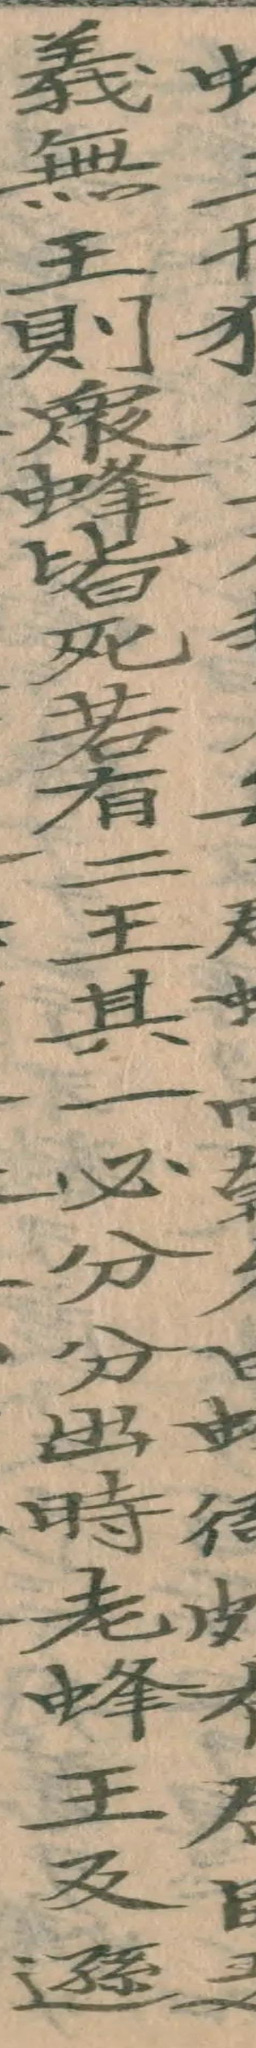義無王則衆蜂皆死若有二王其一必分分出時老蜂王及遜
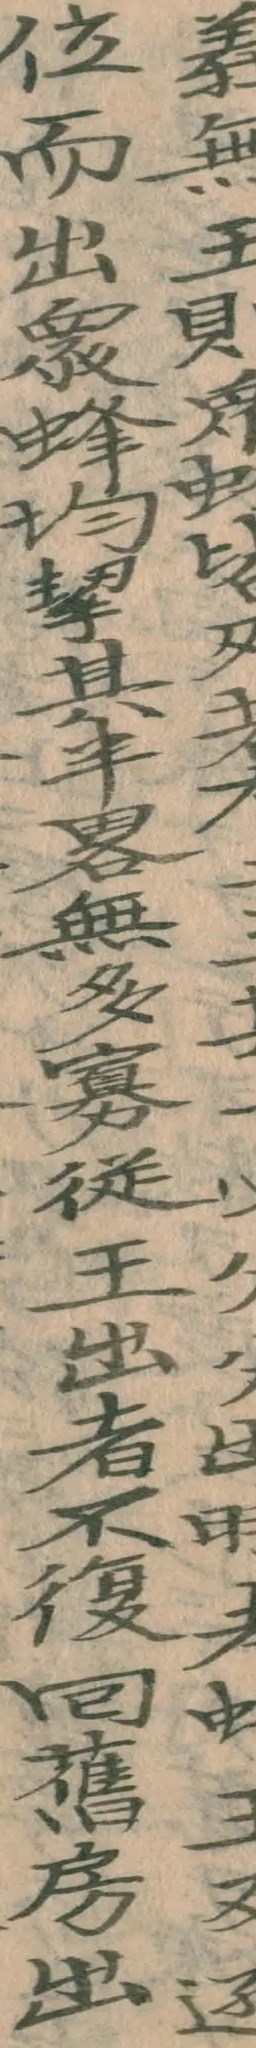位而出衆蜂均挈其半畧無多寡従王出者不復囘𦾔房出
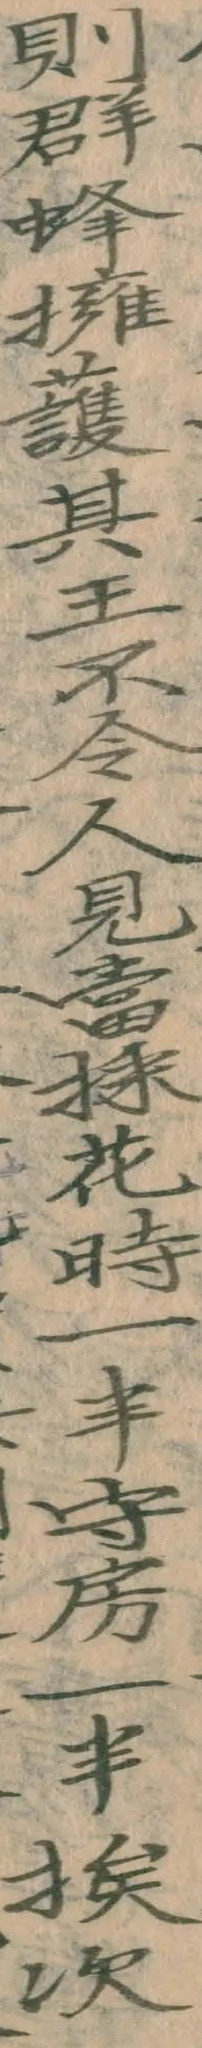則群蜂擁護其王不令人見等當採花時一半守房一半挨次
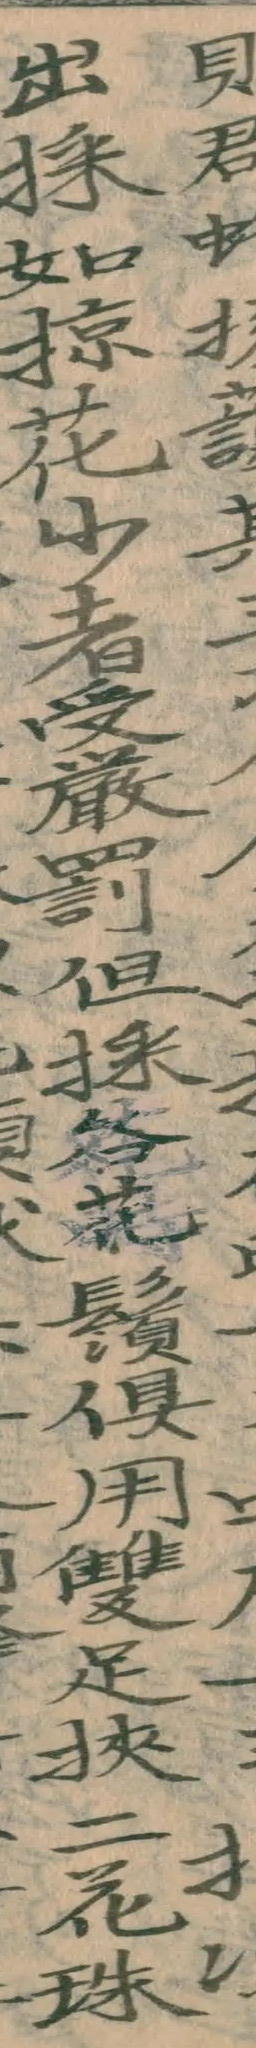出採如掠花少者受厳罰但採各花鬚倶用雙足挟二花珠
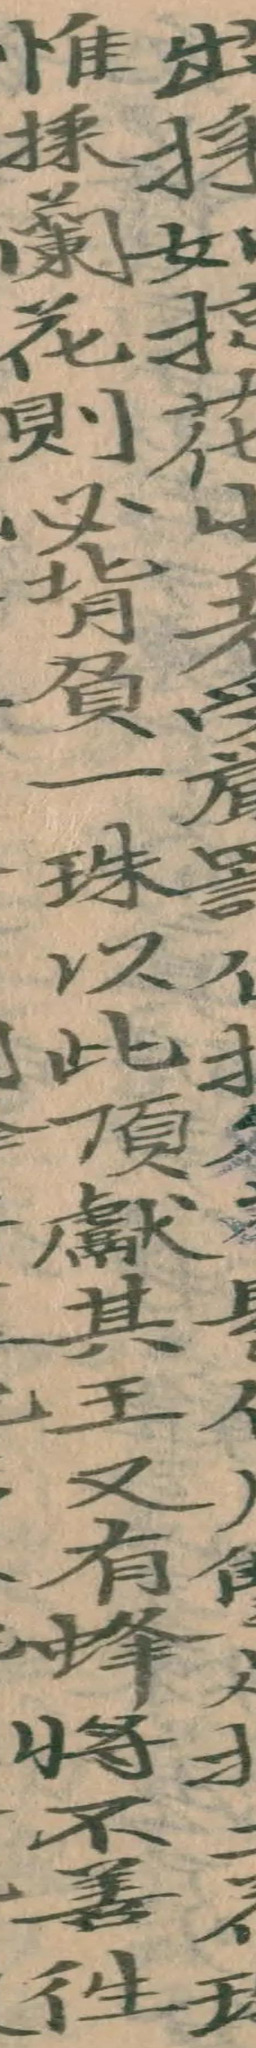惟採蘭花則必背負一珠以此頂獻其王又有蜂将不善往
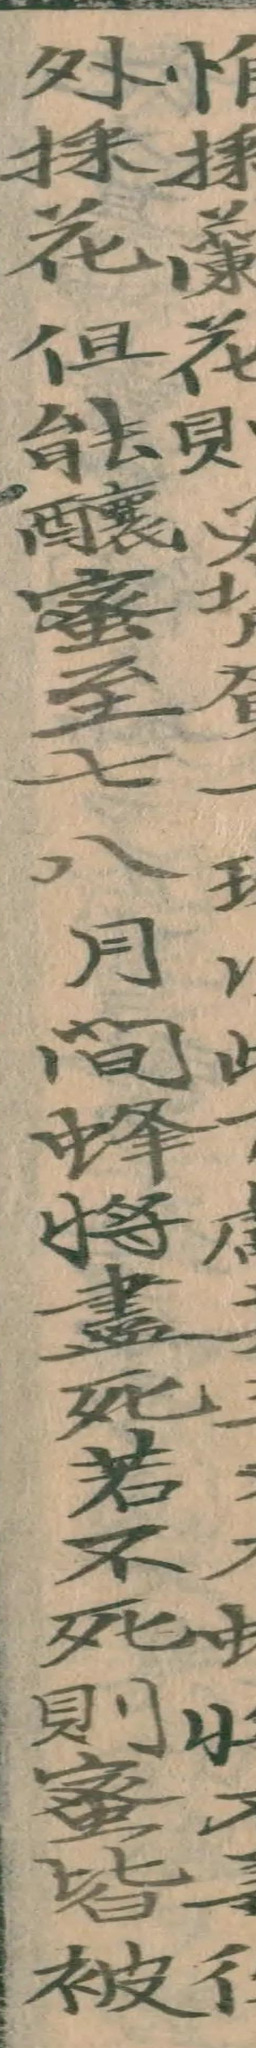外採花但能釀蜜至七八月間蜂将盡死若不死則蜜皆被
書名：千蟲譜 3巻. [1]
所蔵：国立国会図書館 National Diet Library, JAPAN
